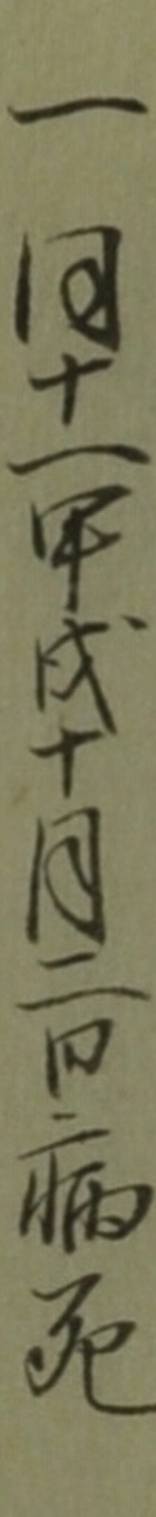一同十一甲戌十月二日病死
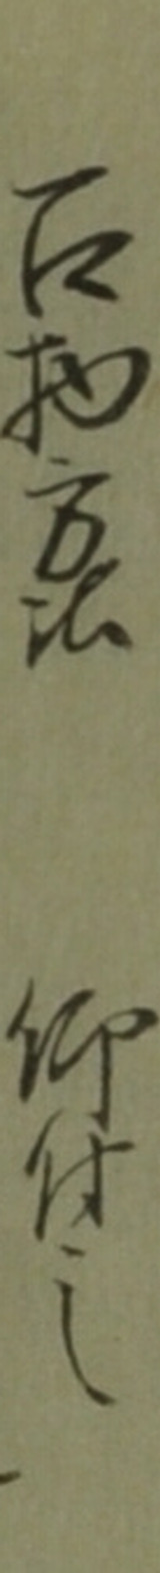召物方被仰付之
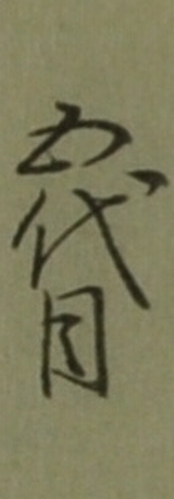五代目
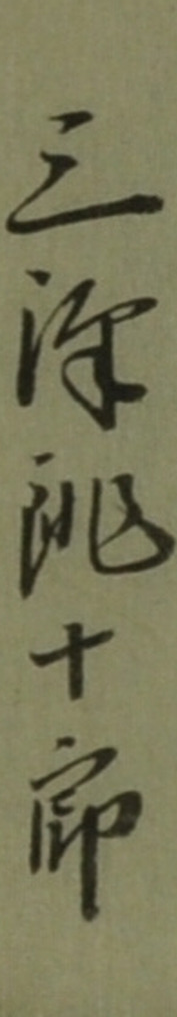三沢緋十郎
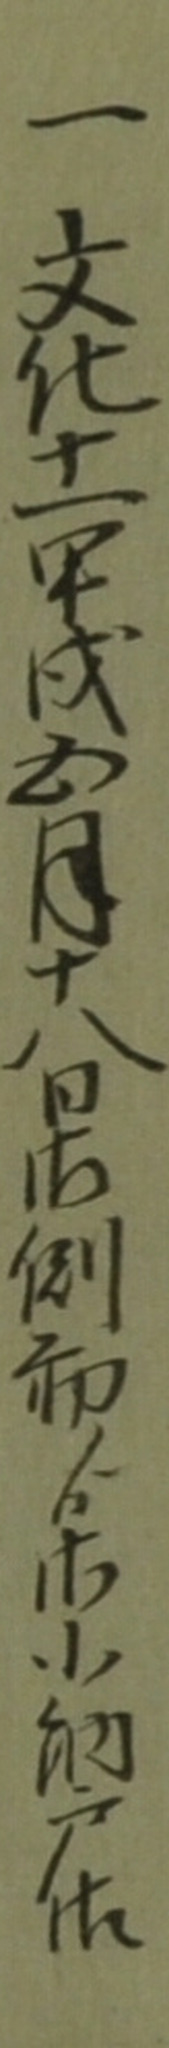一文化十一甲戌五月十八日御側勤ゟ御小納戸御
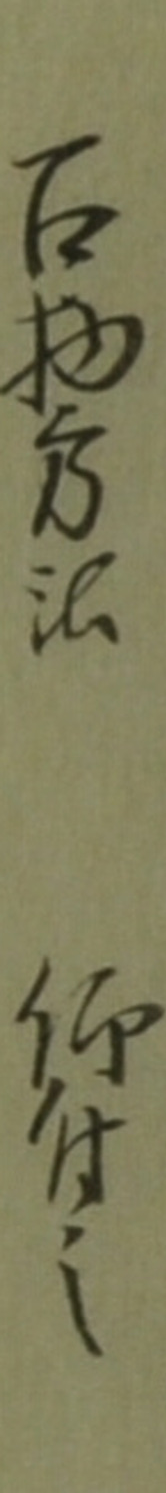召物方被仰付之
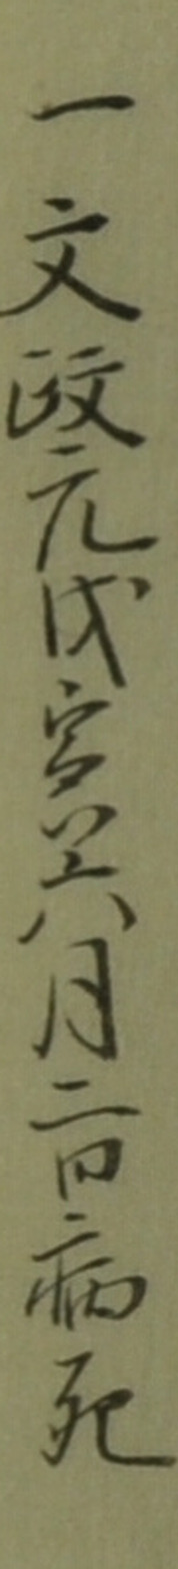一文政元戊寅六月二日病死

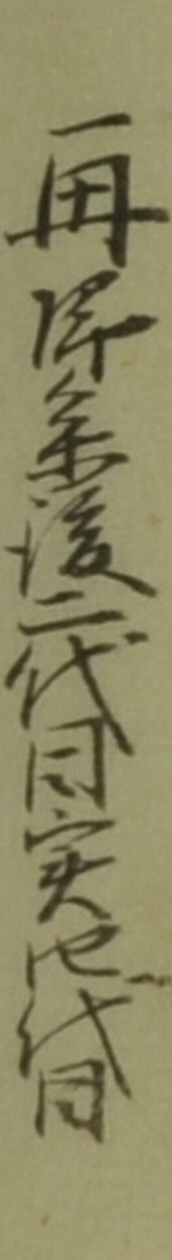再帰参後二代目実四代目
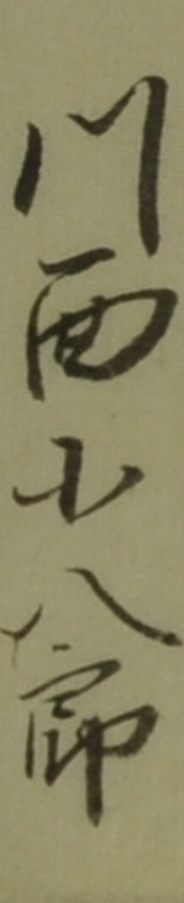川西小八郎
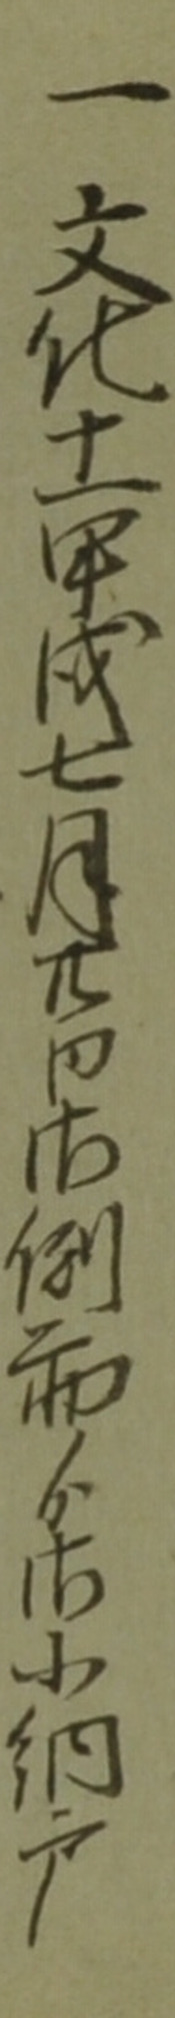一文化十一甲戌七月廿四日御側勤ゟ御小納戸
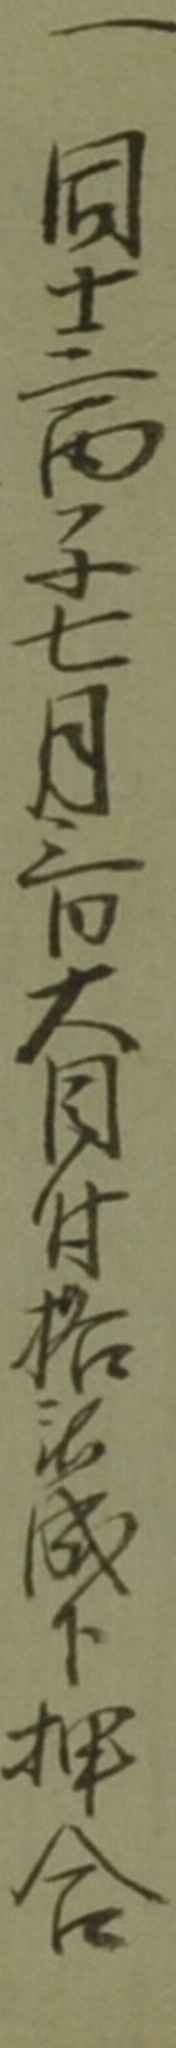一同十三丙子七月三日大目付格被成下押合
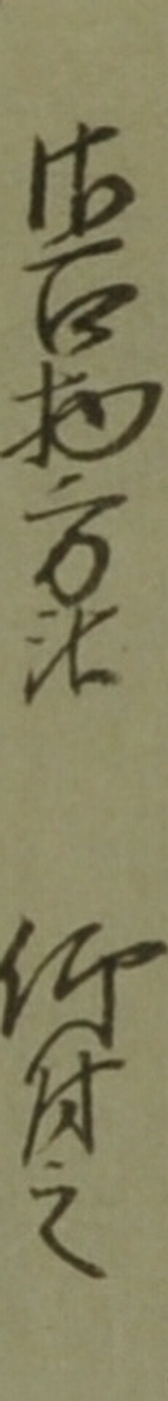御召物方被仰付之
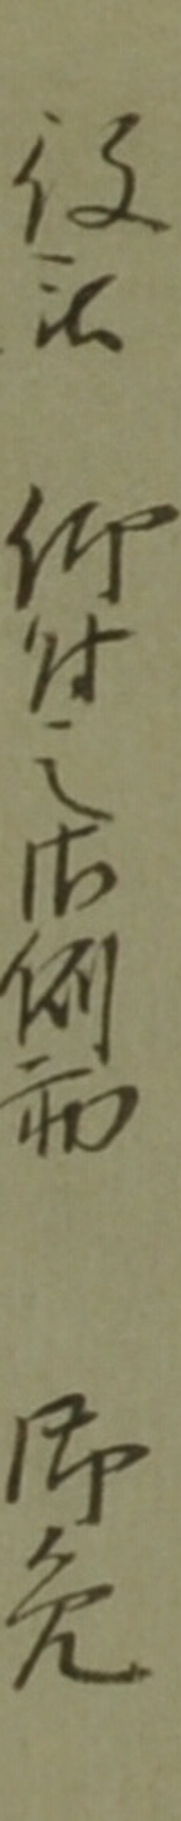役被仰付之御側勤御免
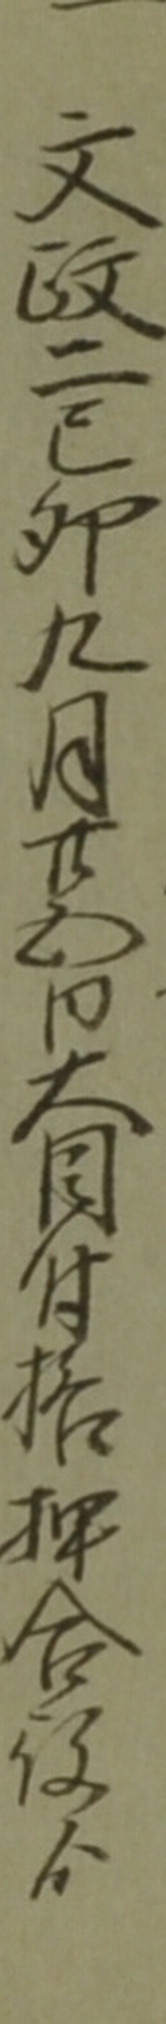一文政二己卯九月廿五日御目付格押合役ゟ
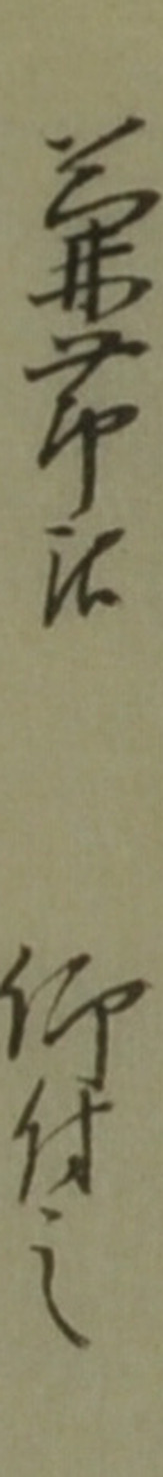兼帯被仰付之
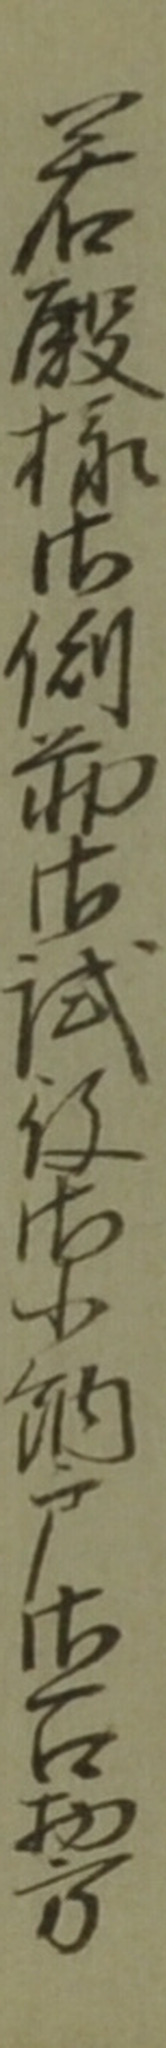若殿様御側勤御試役御小納戸御召物方
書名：諸御役代々録（四）
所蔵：伊那市立高遠町図書館・合同会社AMANE
